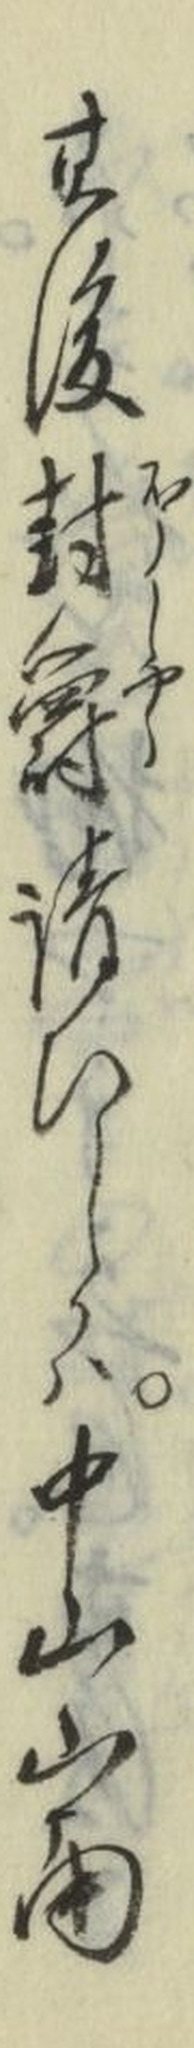其後封爵請ひしかは。中山山南
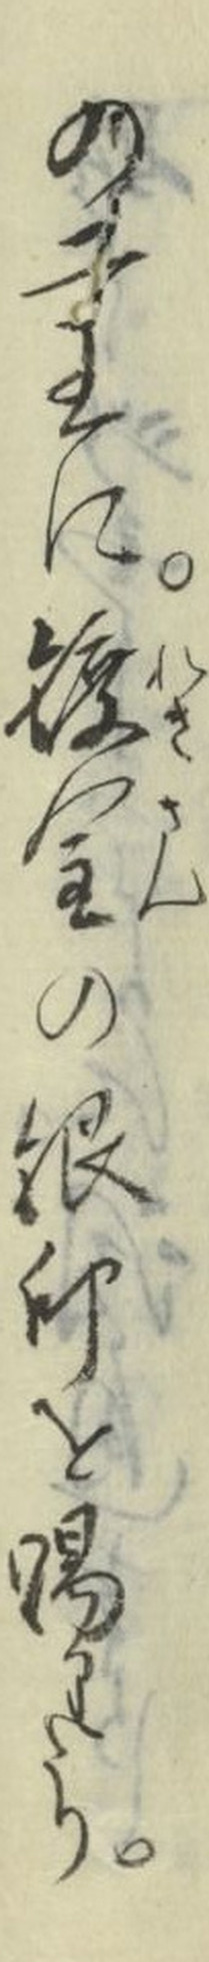の二王に。鍍金の銀印を賜りたり。
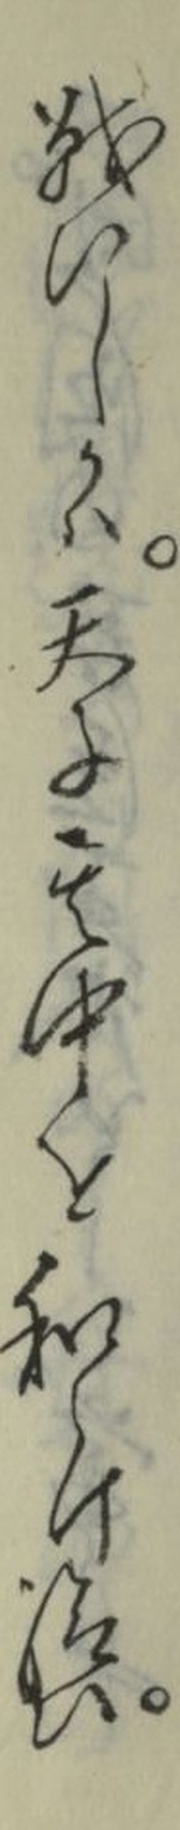戦ひしかは。天子其中を和らけ給ひ。
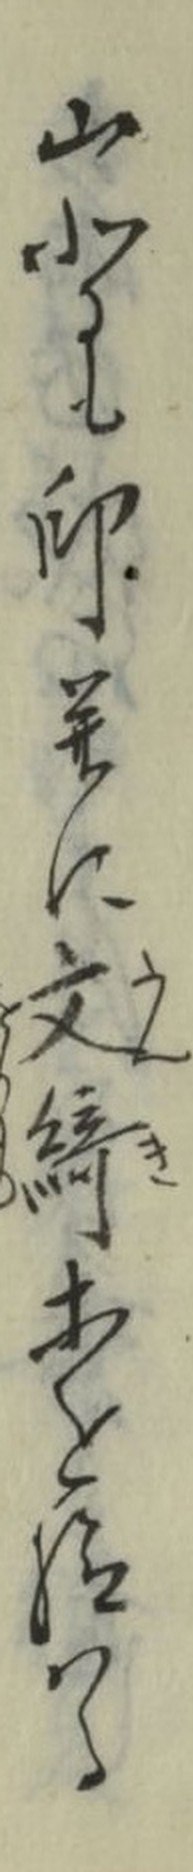山北も印幷に文綺等を給はる

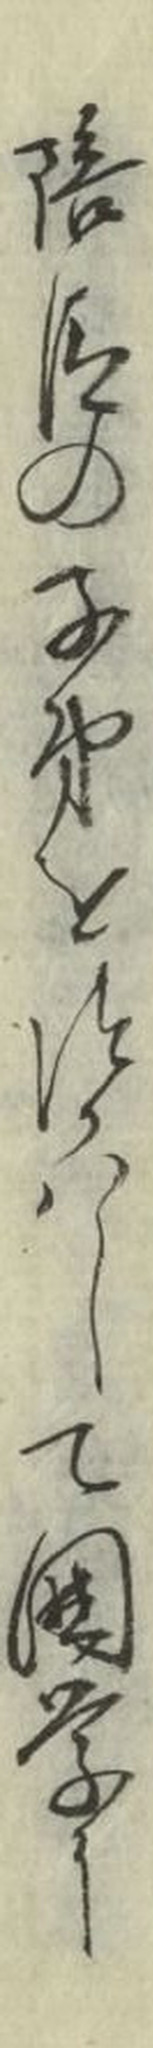陪臣の子弟をつかはして国学に
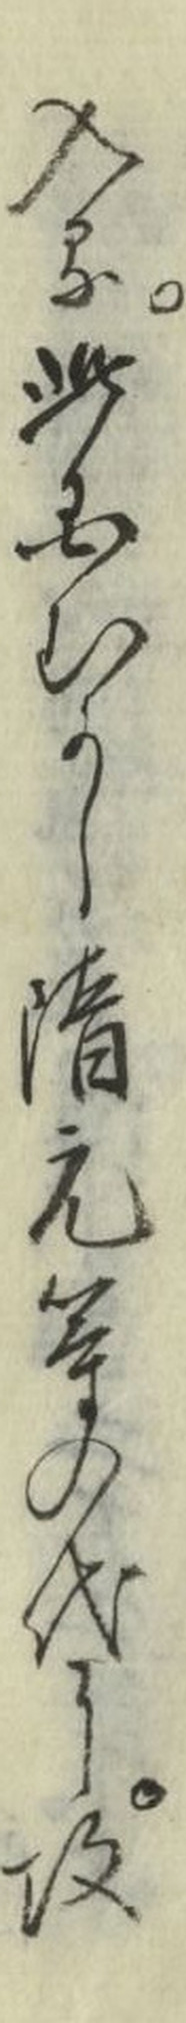入る。此国むかし隋元等の代に。攻
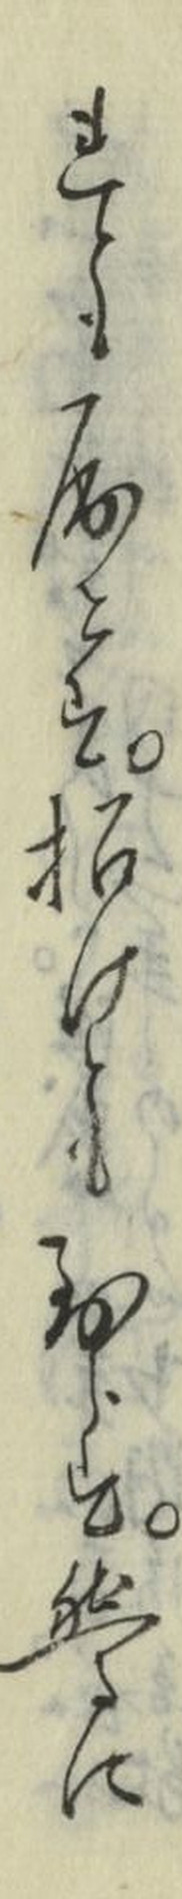れとも屈せす。拓けとも到らす。然るに
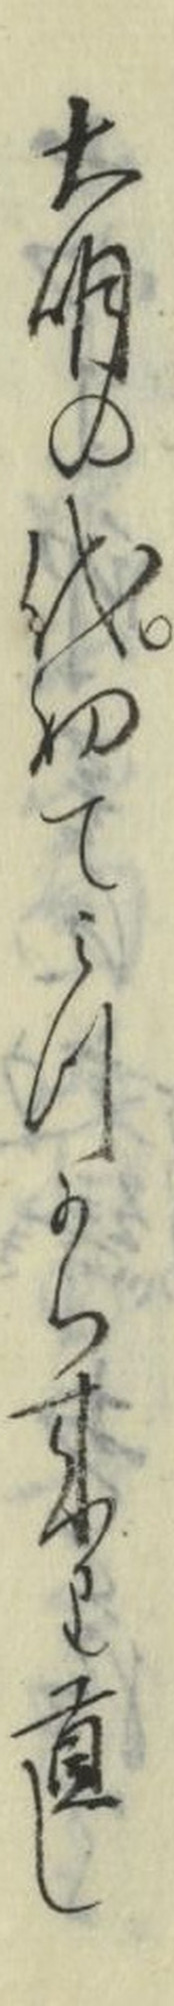大明の代。初てみつから来り貢し
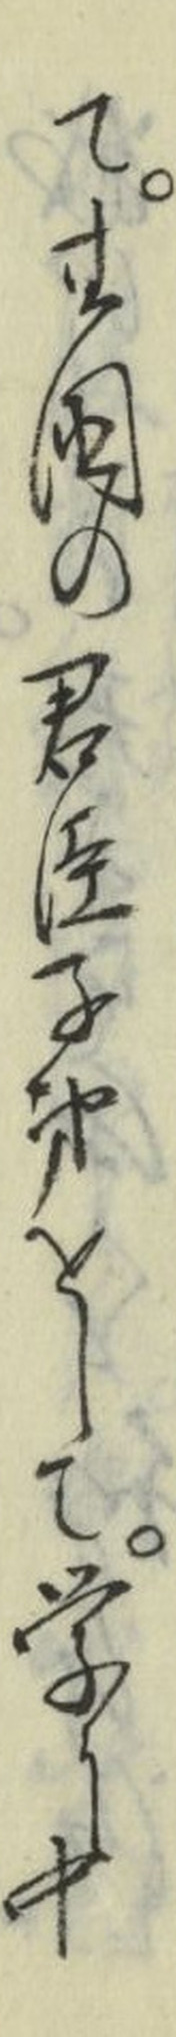て。其国の君臣に弟をして。学に中
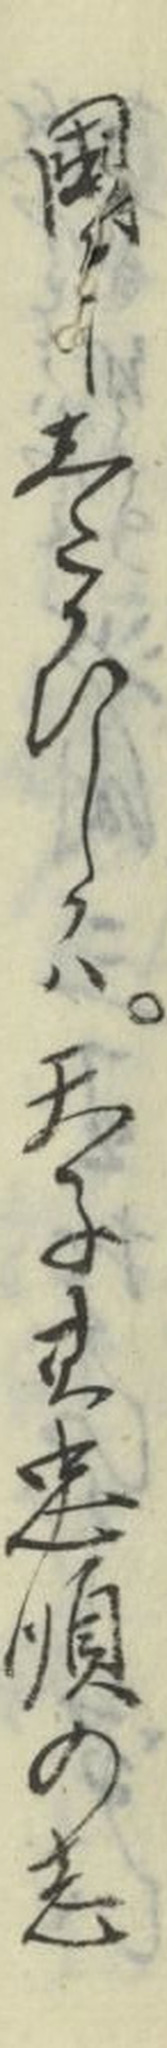国にしたかひしかは。天子其忠順の志
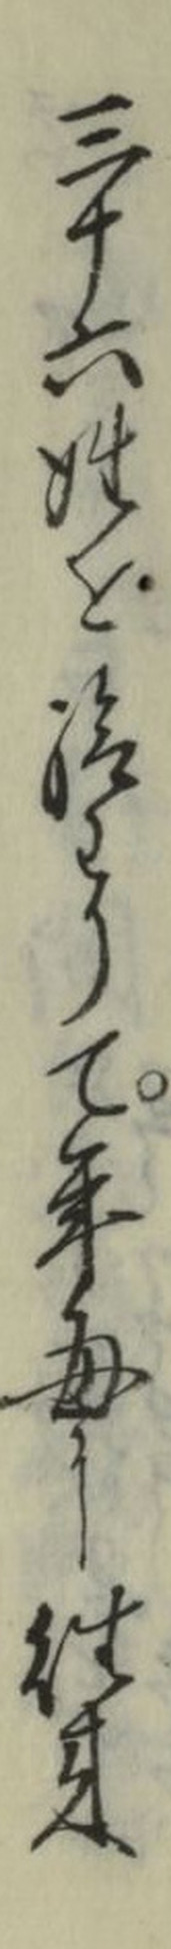三十六姓を給わりて。年毎に往来
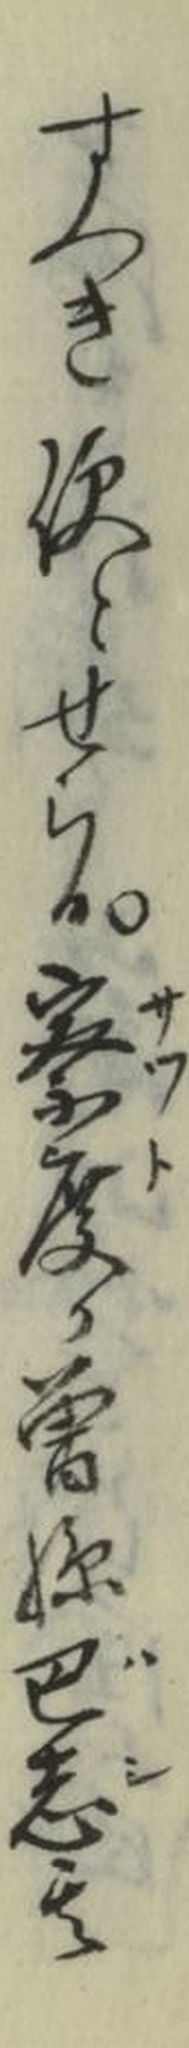すへき使とせらる。察度か曾孫巴志其
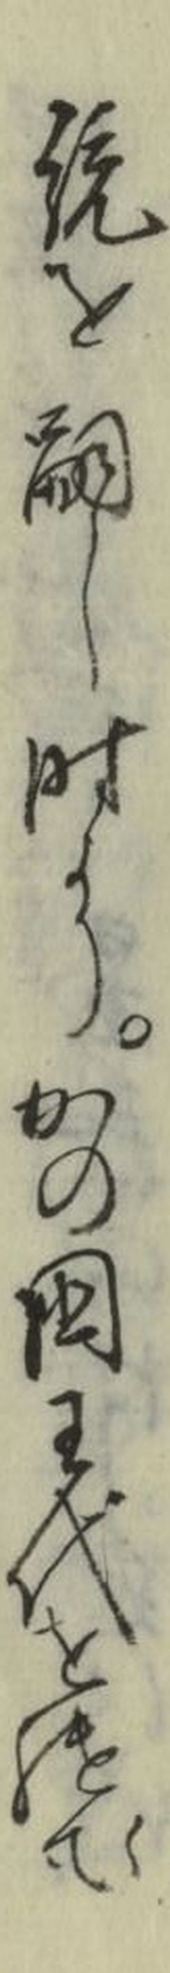統を嗣し時より。かの国王代を継てし
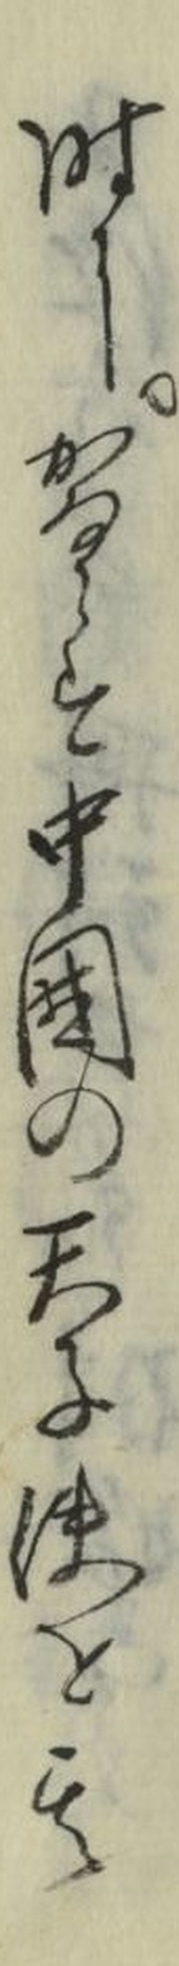時に。かならす中国の天子使を其

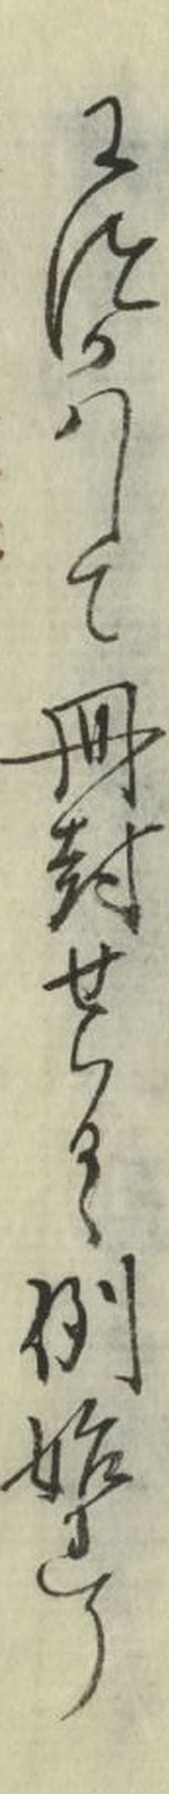につかはして冊封せらるゝ例始れり
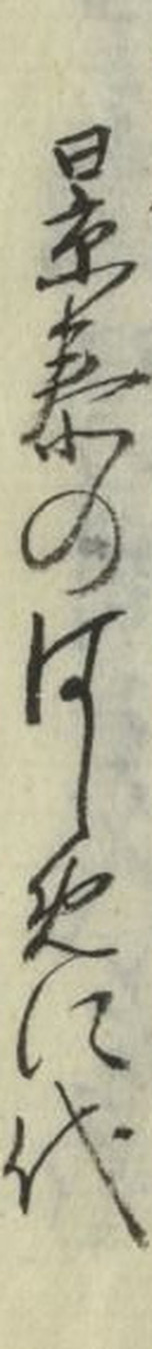景泰のはしめに代
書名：琉球人来朝記 一之二
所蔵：University of the Ryukyus Library
